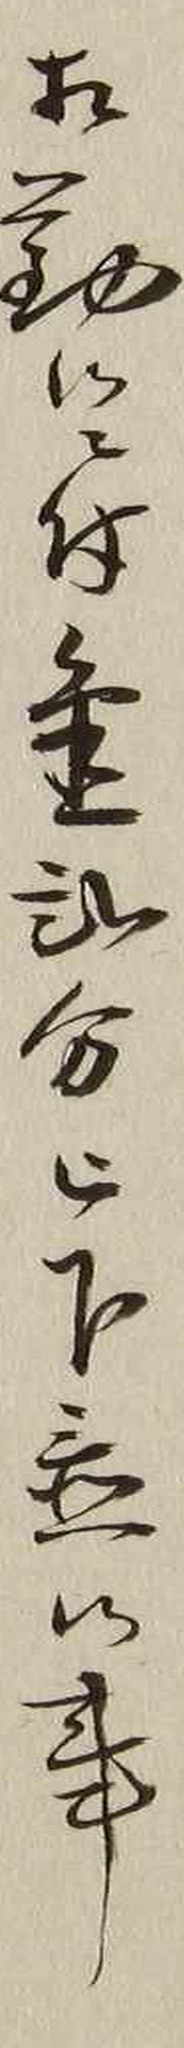相勤候ニ付金弐分被下置候事
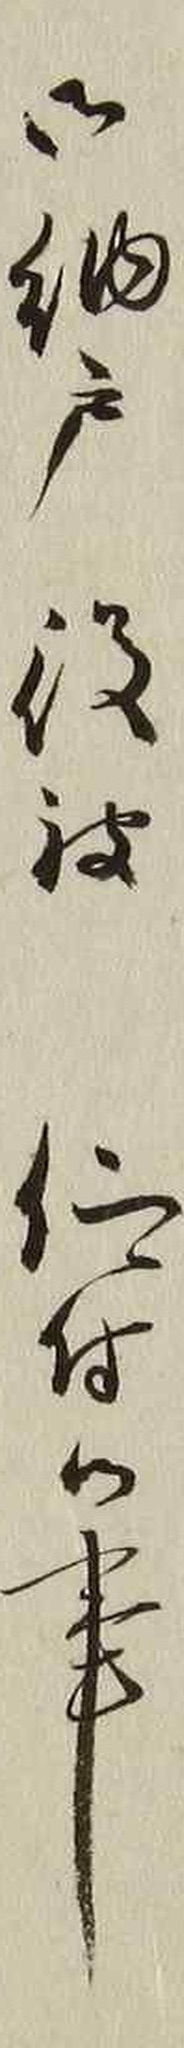御納戸役被仰付候事
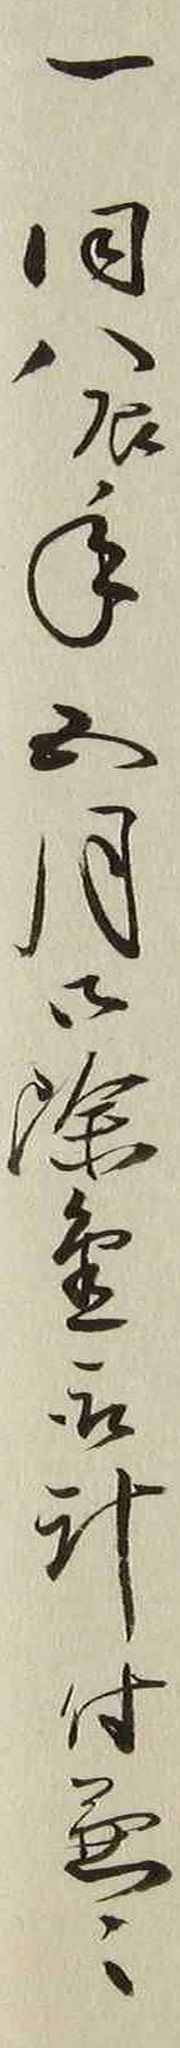一同八辰年五月御除金取計付兼々
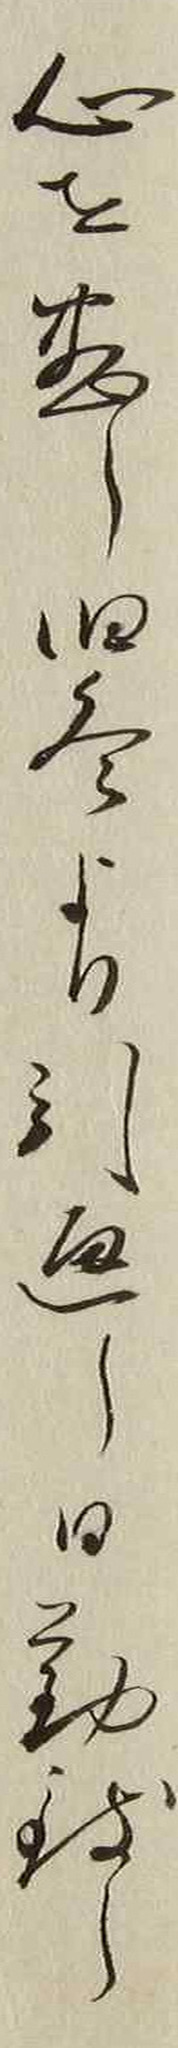心を尽し旧冬より引通し日勤致し
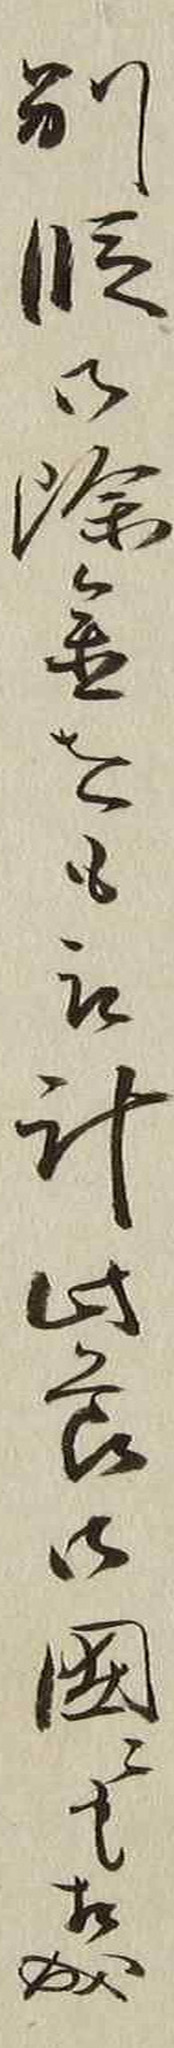別段御除金をも取計此節御囲ニも相成
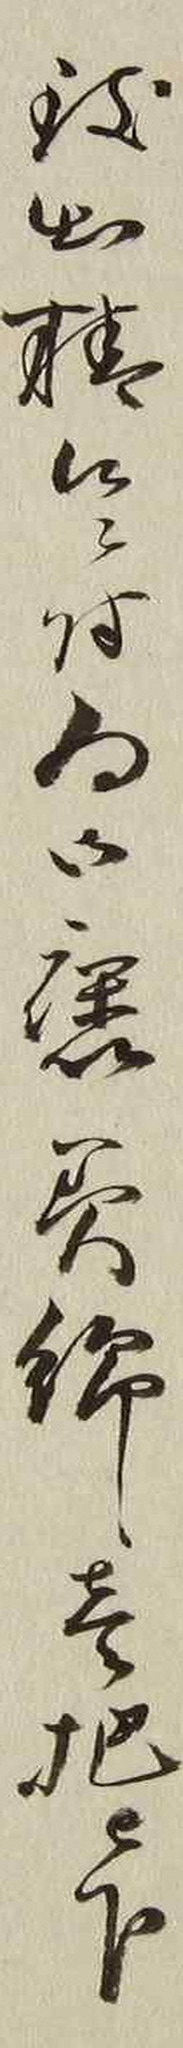致出精候ニ付為御褒美綿壱把被下
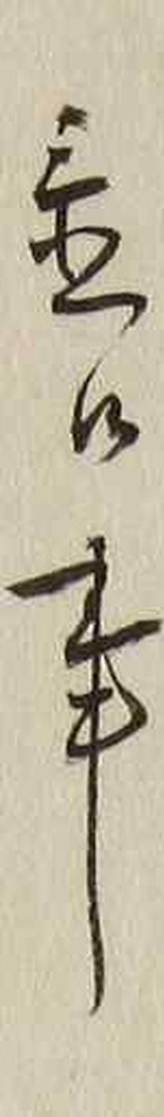置候事
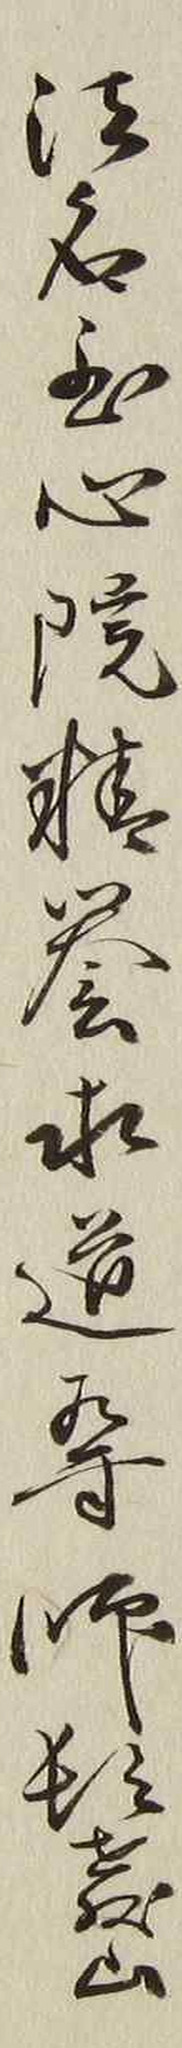法名至心院精誉求道尋師頓教山
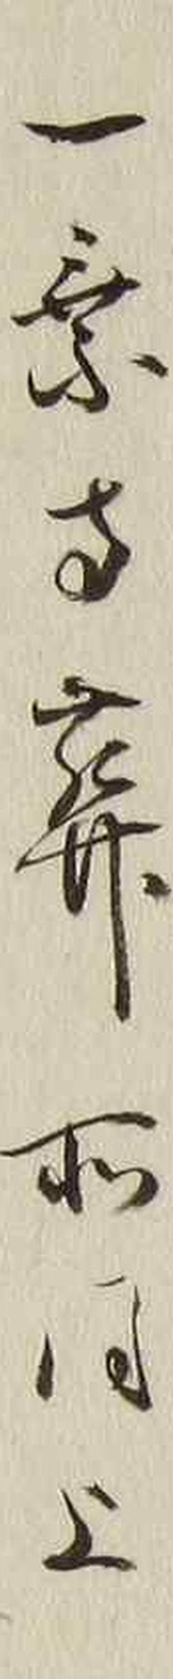一乗寺葬所同上

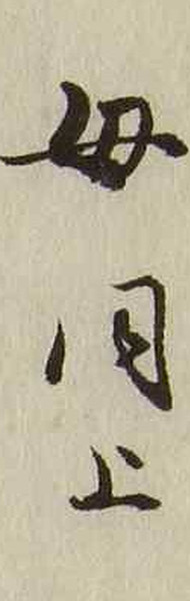母同上
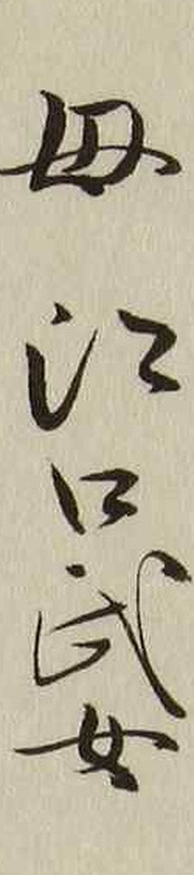母江口氏女
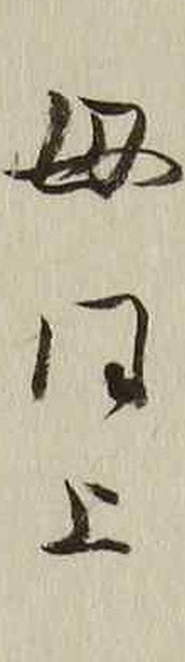母同上
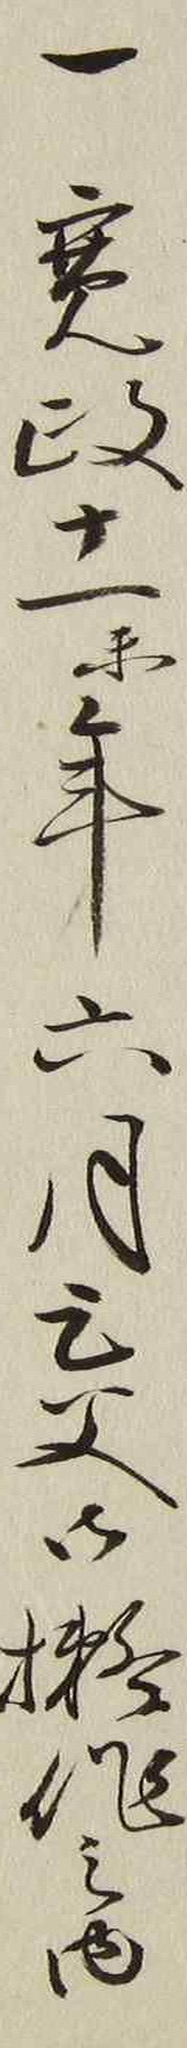一寛政十一未年六月亡父御擬作之内
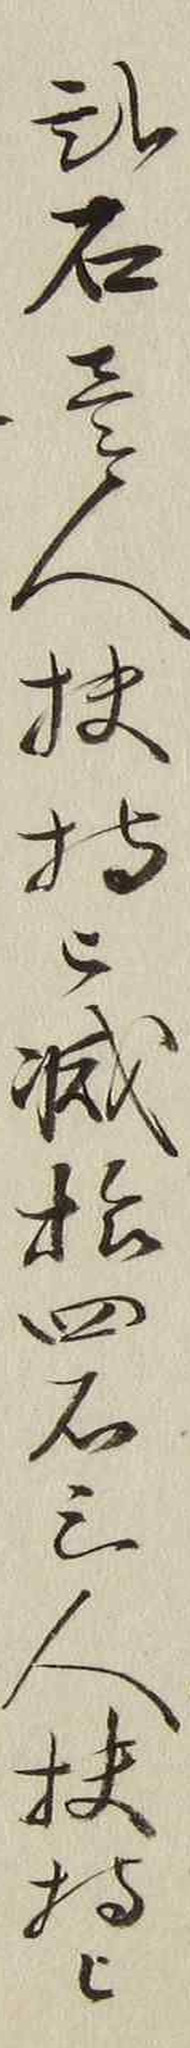弐石壱人扶持被減拾四石三人扶持被
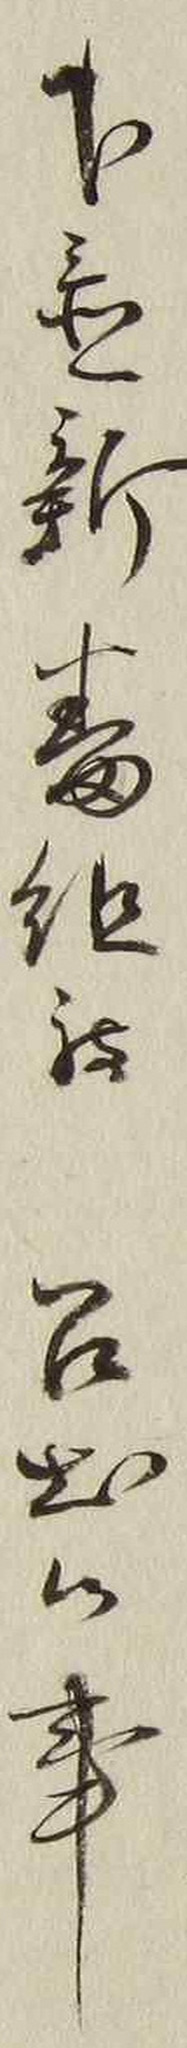下置新番組被召出候事
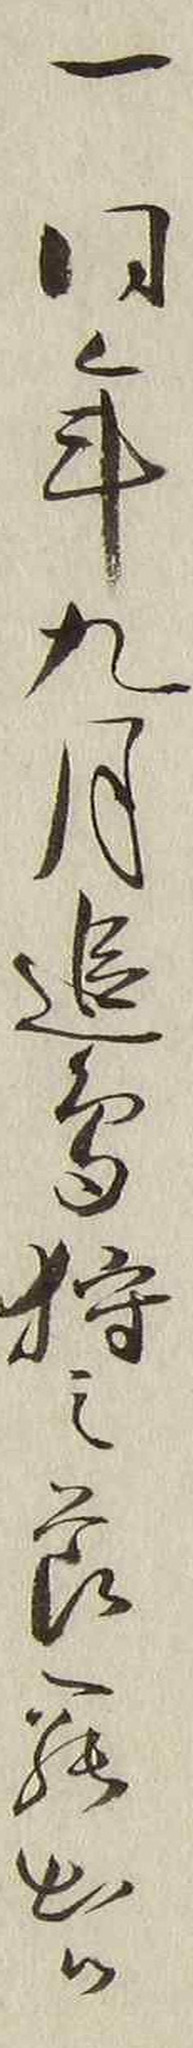一同年九月追鳥狩之節罷出候
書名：諸士系譜　巻之163　な之部5
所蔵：会津若松市立会津図書館
